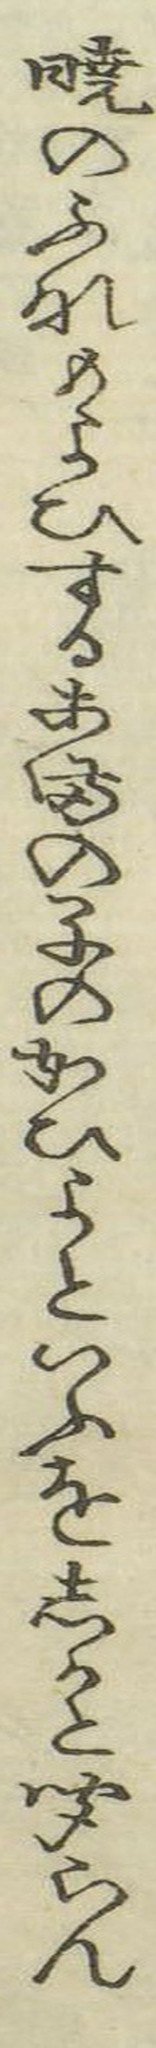暁のふなもよひするあまの子のかひよといふをしかと聞らん

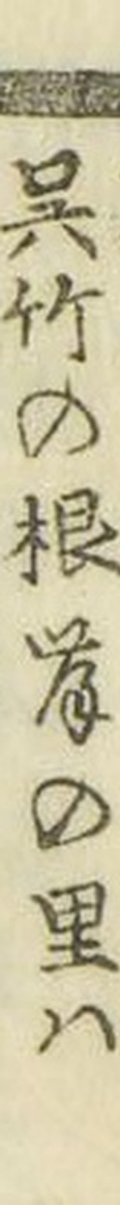呉竹の根岸の里は
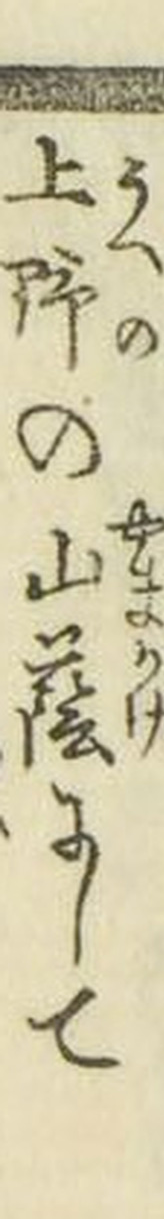上野の山蔭にして
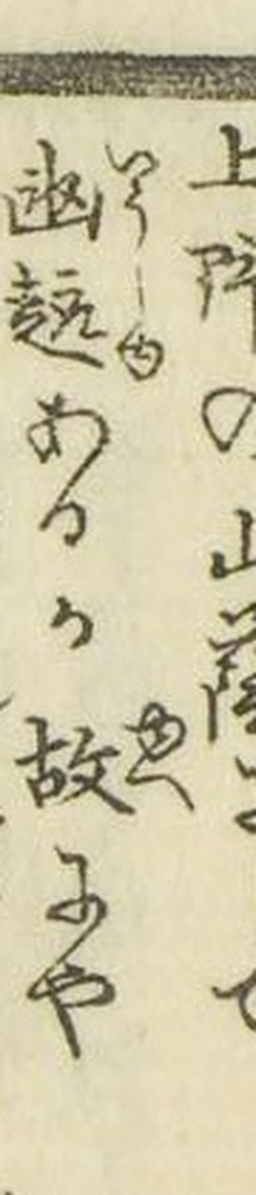幽趣あるか故にや
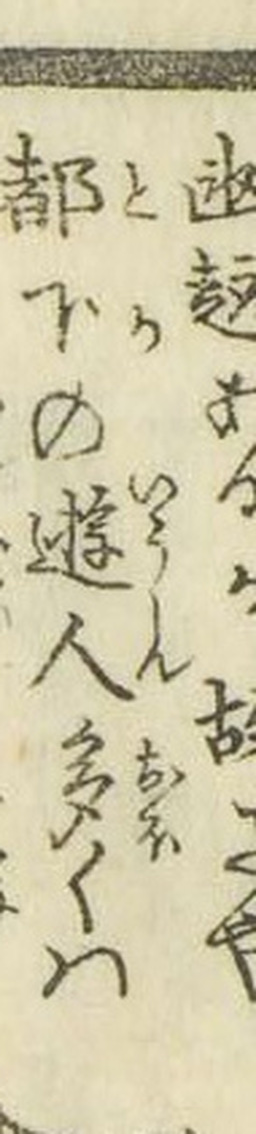都下の遊人多くは
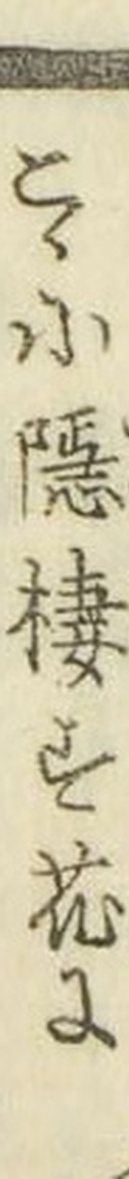こゝに隠棲す花に
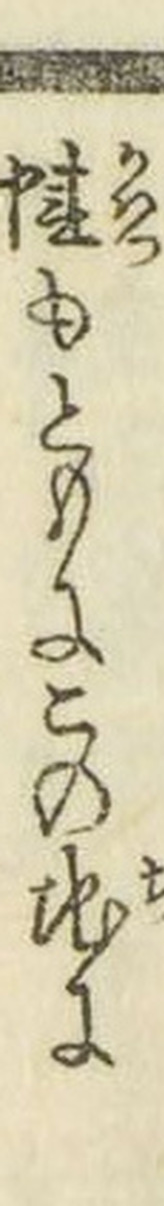蛙もともにこの地に
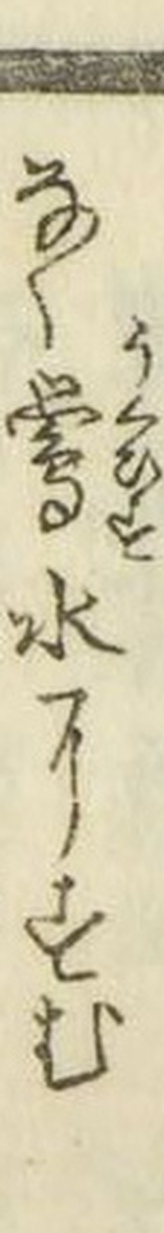なく鶯水にすむ
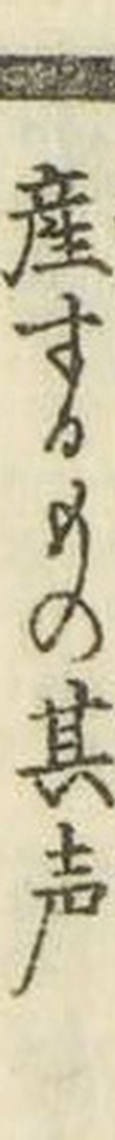産するもの其声
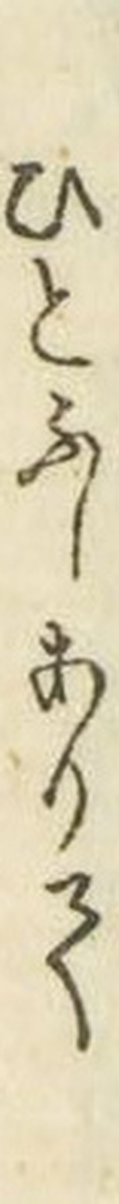ひとふしありて
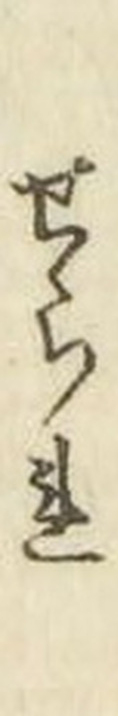せられ
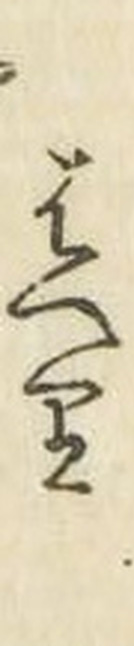はへり

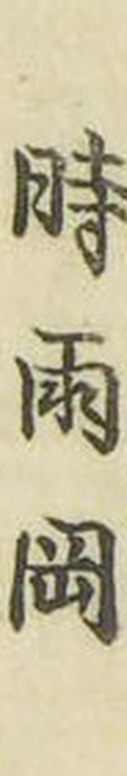時雨岡
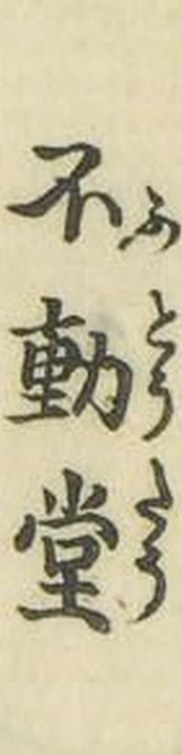不動堂
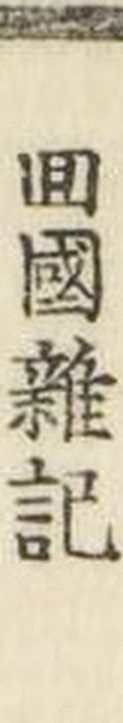回国雑記
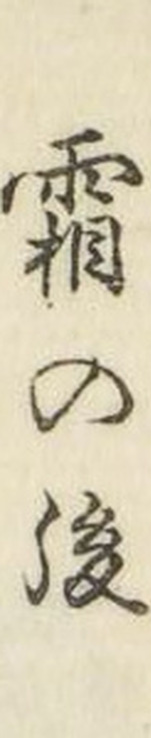霜の後
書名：江戸名所図会 20巻 巻之17
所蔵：東京学芸大学教育コンテンツアーカイブ
